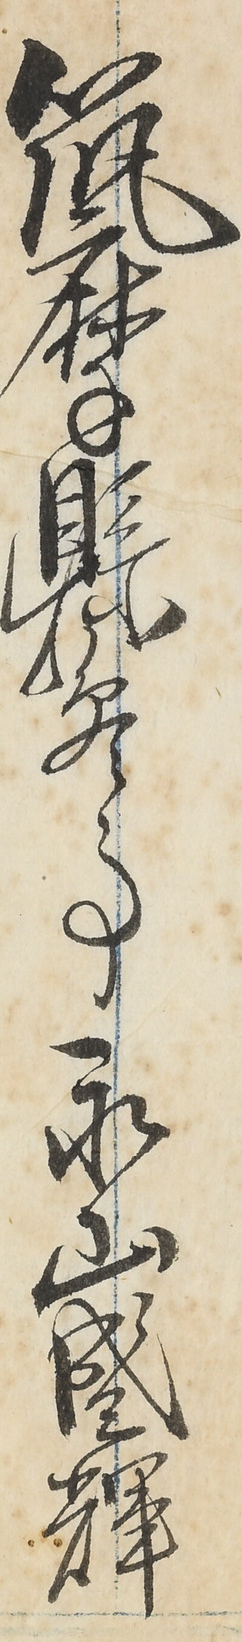筑摩県参事永山盛輝
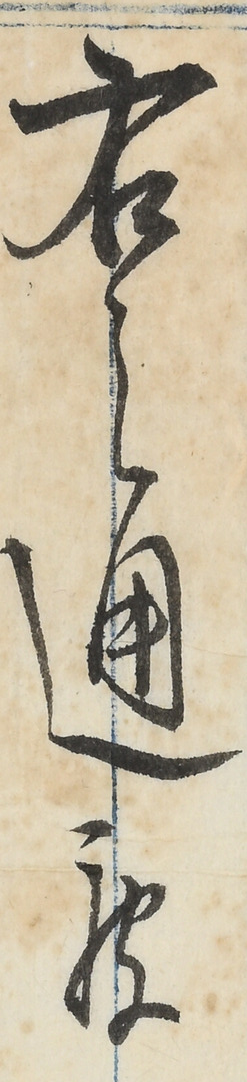右之通被
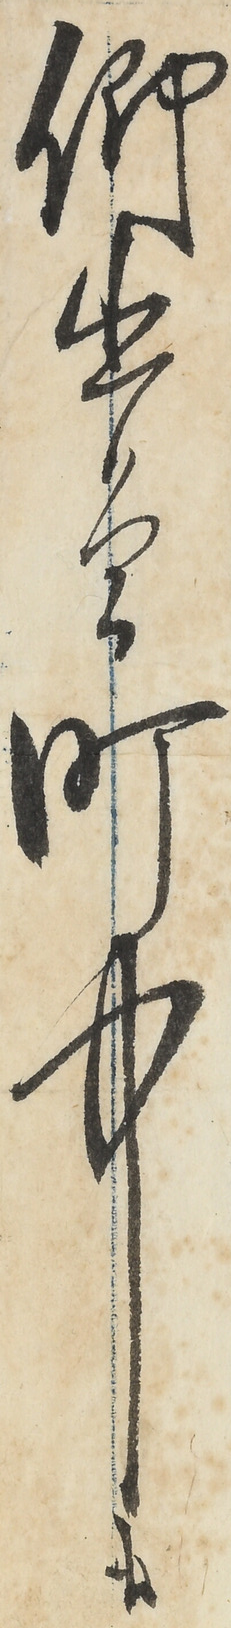仰出候間町中江

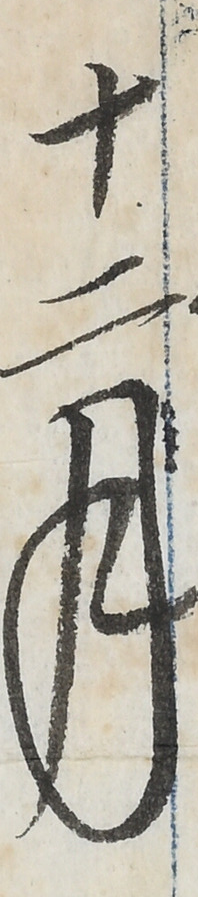十二月
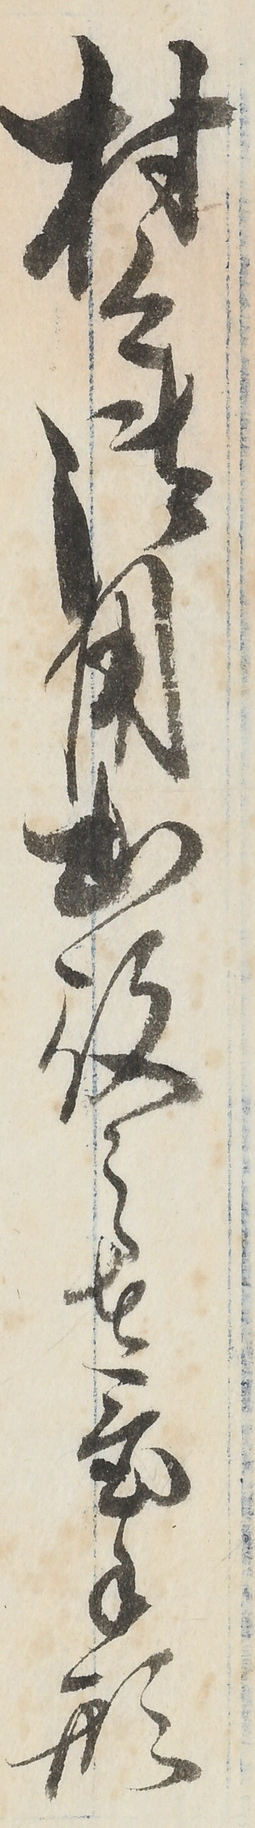村々御用出役之者置手形
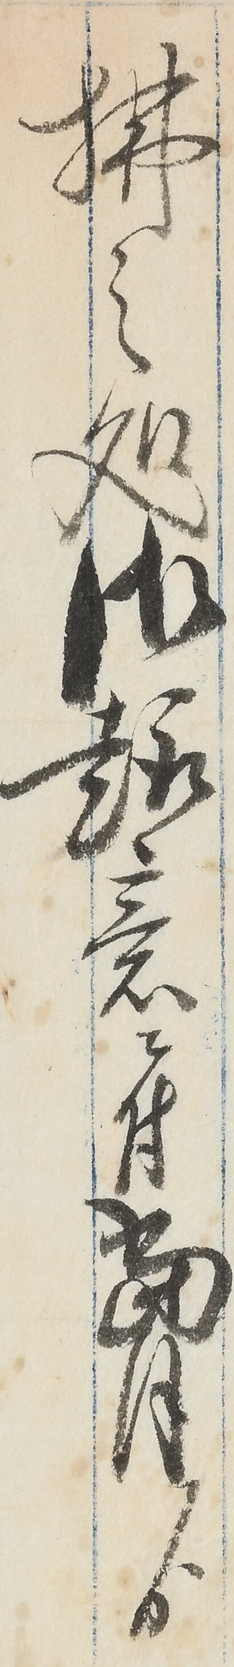払之処御趣意ニ付当月ゟ
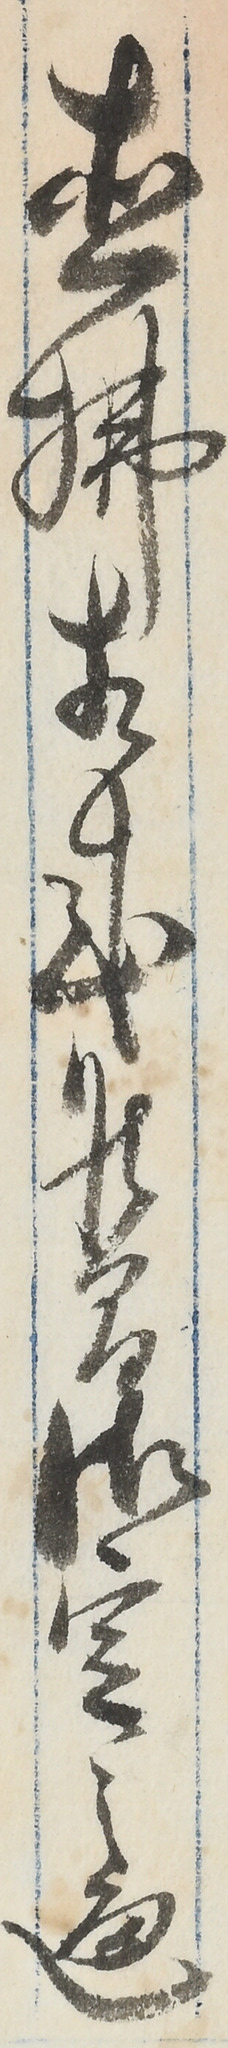直払相成候間御定之通
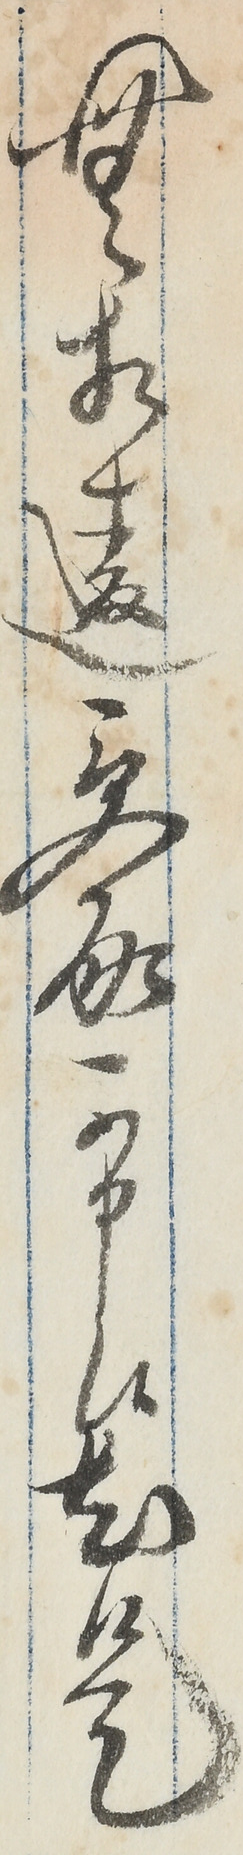無相違受取可申候尤是
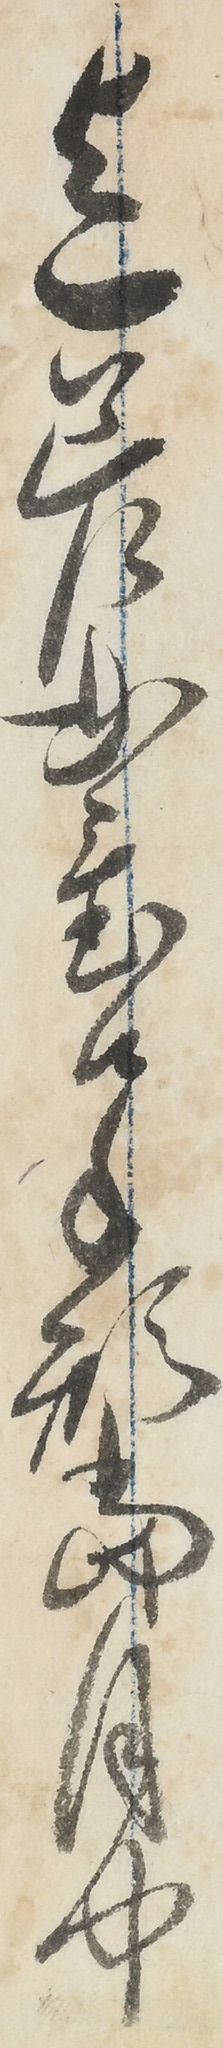迄差出置候手形当月中

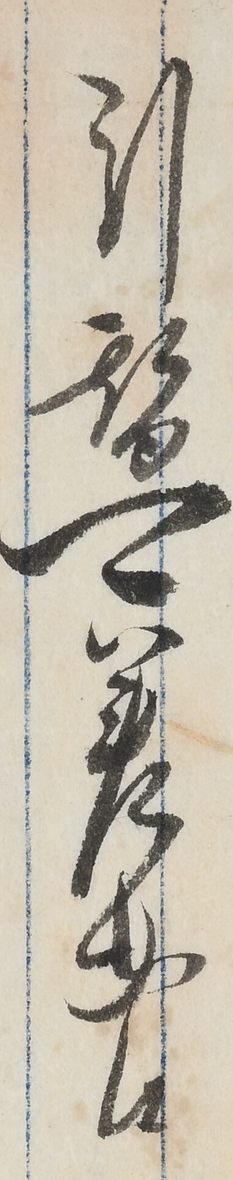引替可差出候
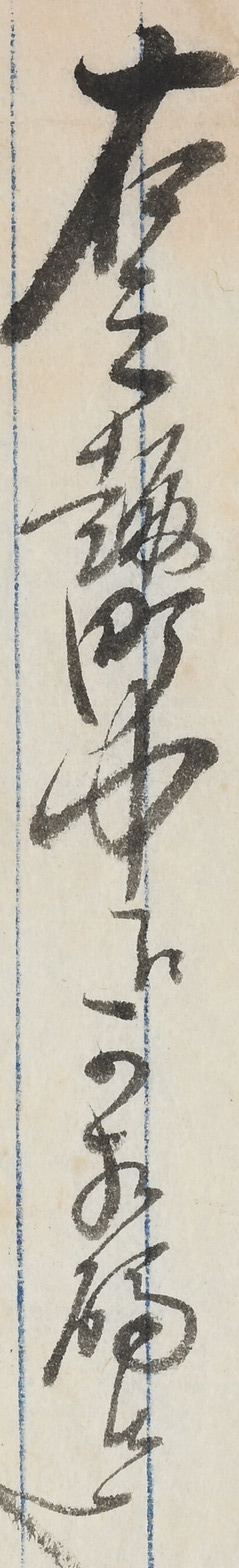右之趣町中江可相触候也
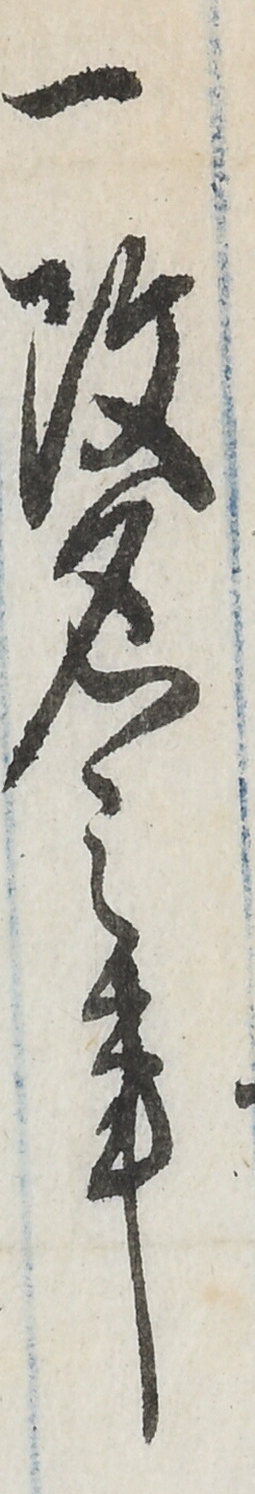一改名之事
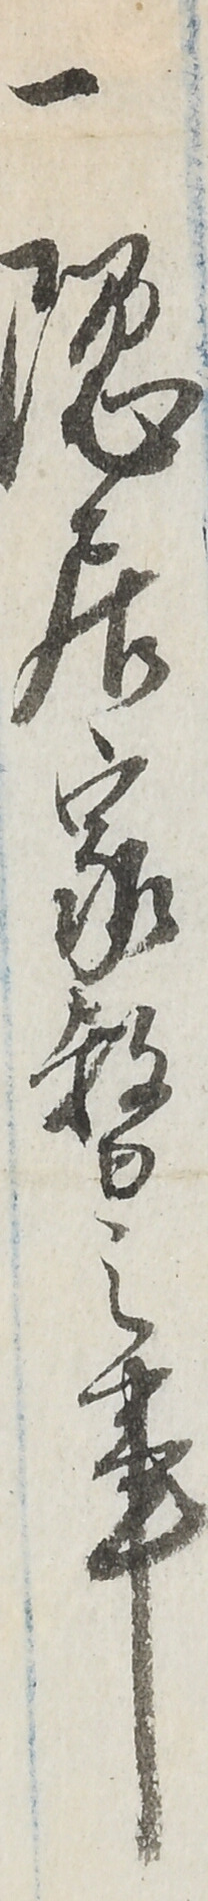一隠居家督之事
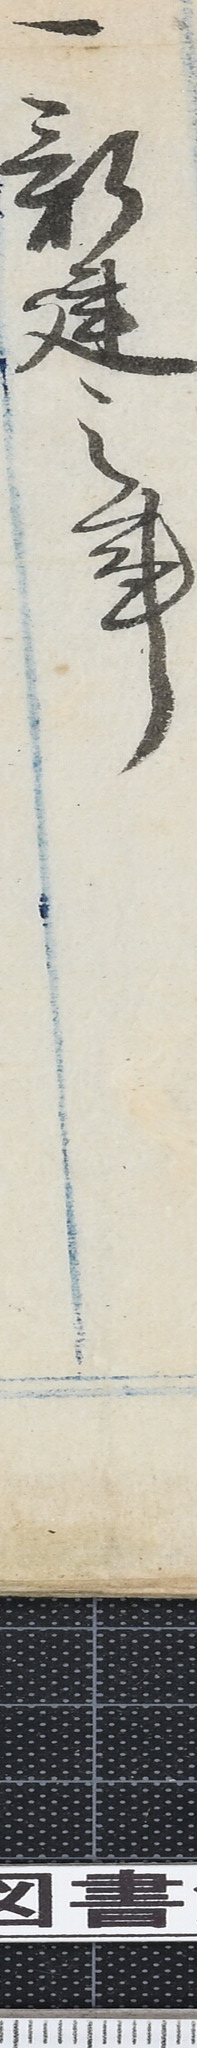一新建之事
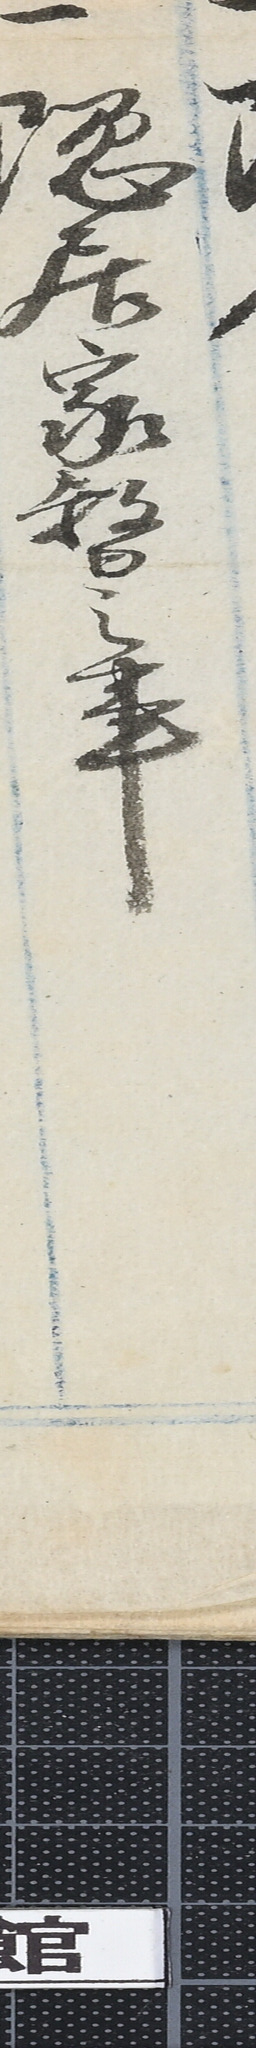一隠居家督之事
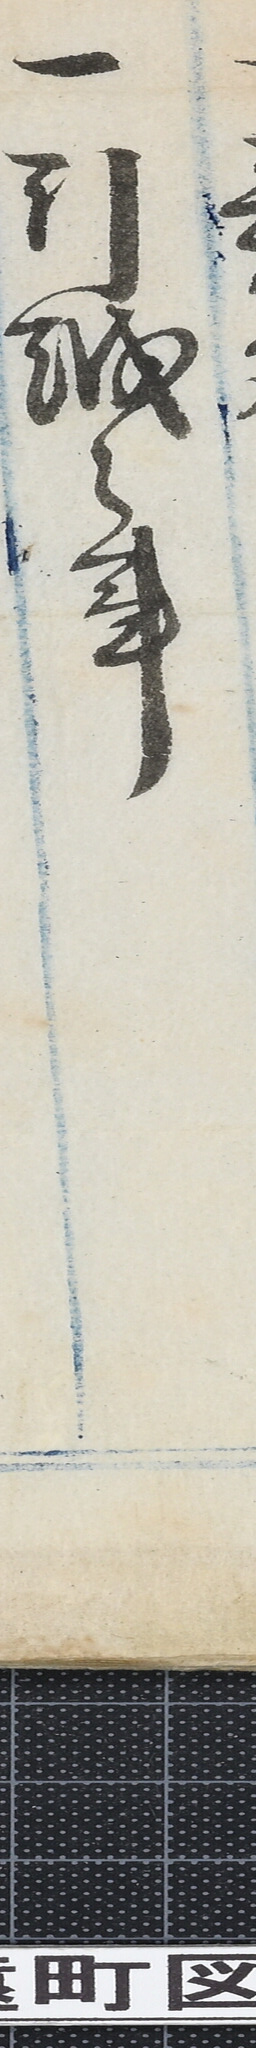一引越之事
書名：布達書留
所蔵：伊那市立高遠町図書館・合同会社AMANE
